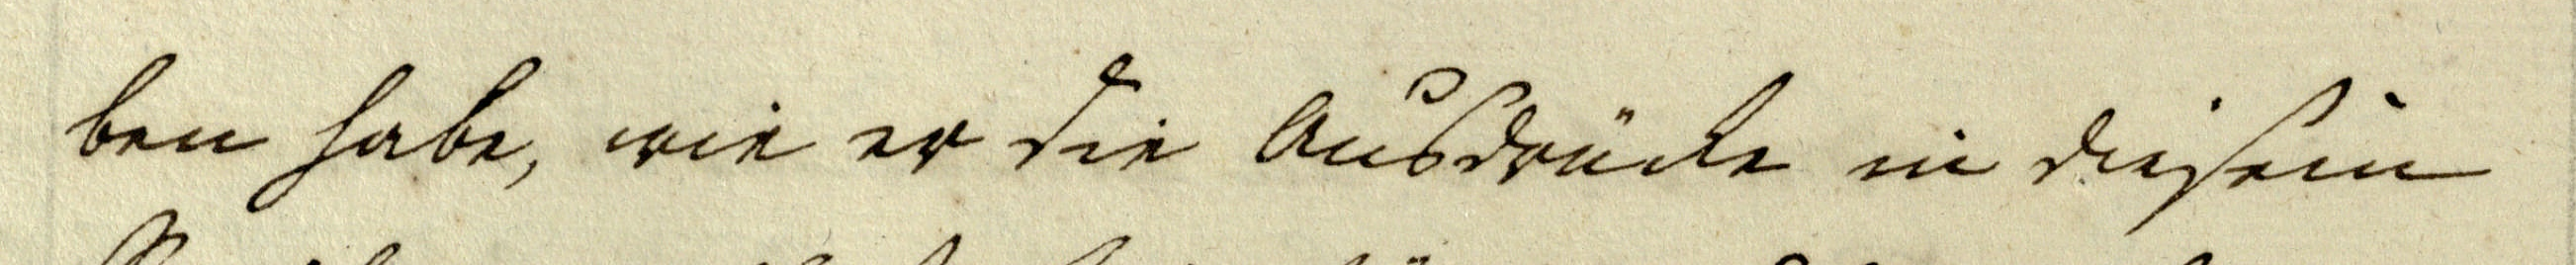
ben habe, wie er die Ausdrücke in diesem
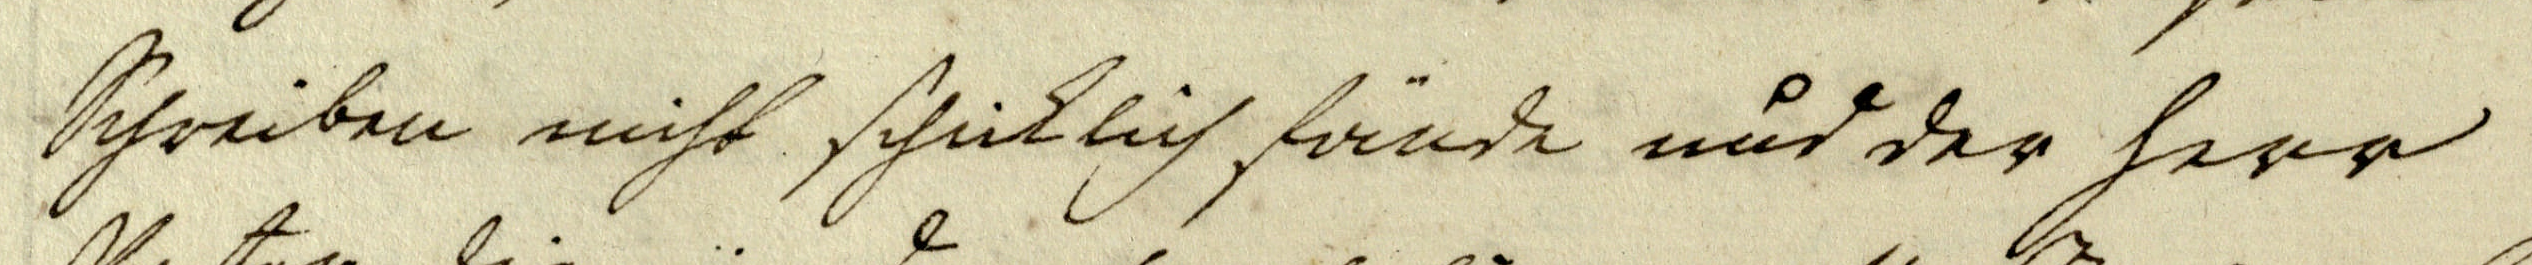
Schreiben nicht schicklich fände und der Herr
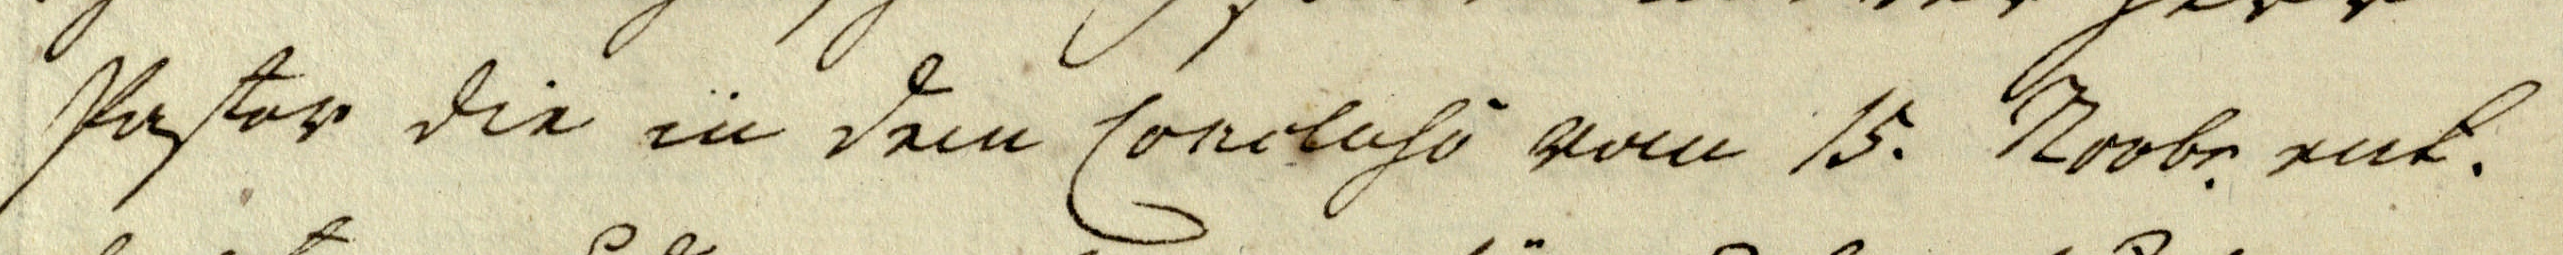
Pastor die in dem Concluso vom 15. Novbr. ent¬
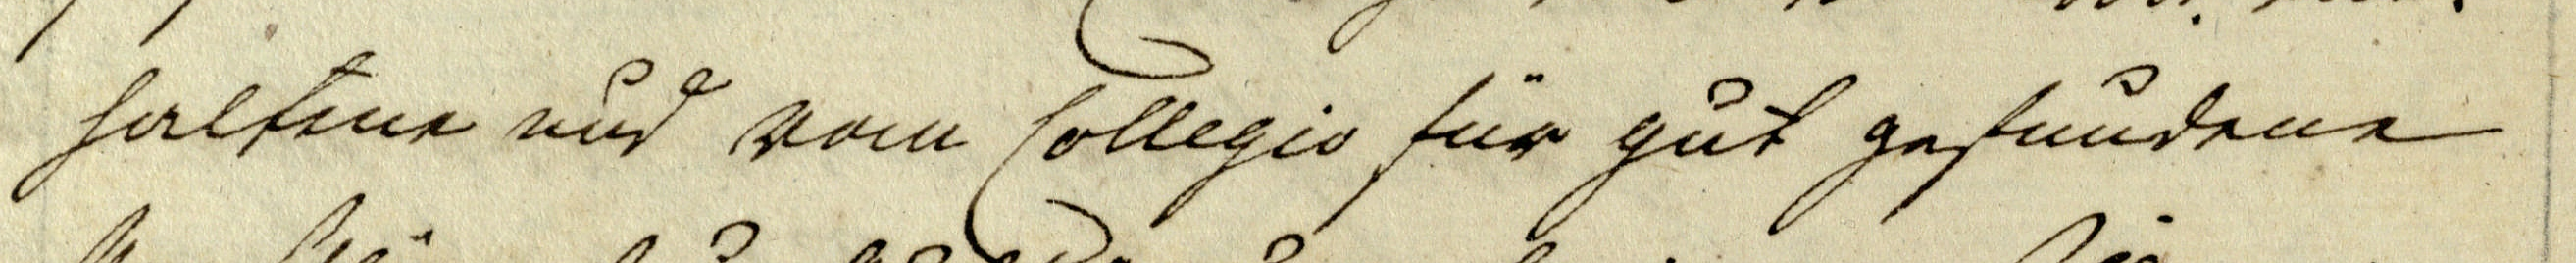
haltene und vom Collegio für gut gefundene
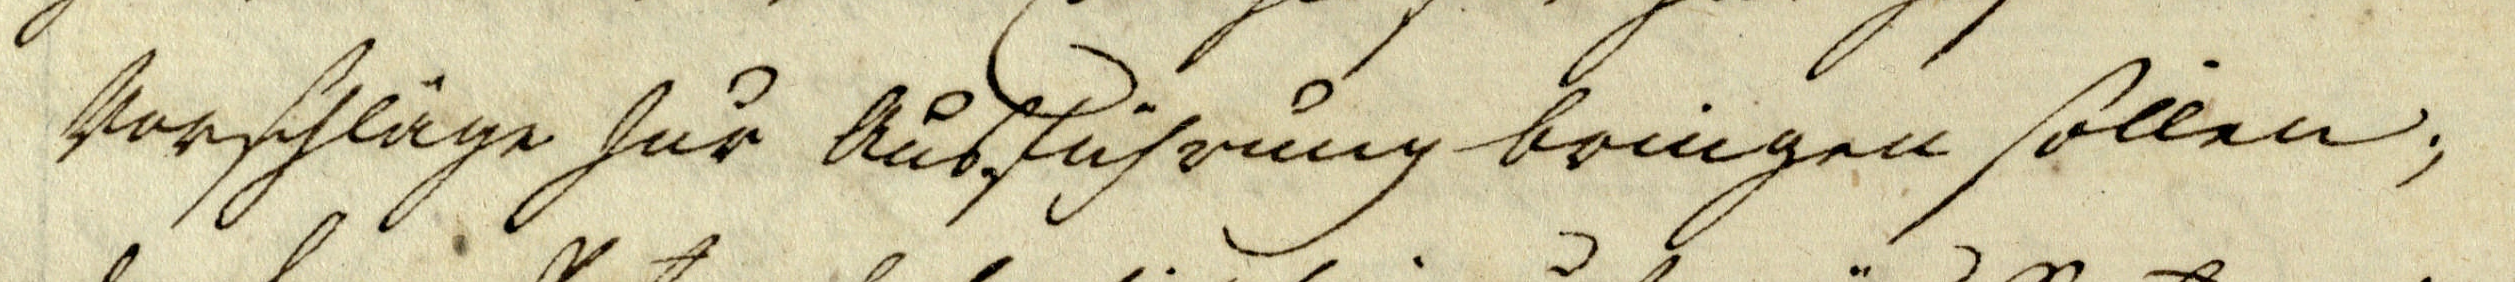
Vorschläge zur Ausführung bringen sollen,
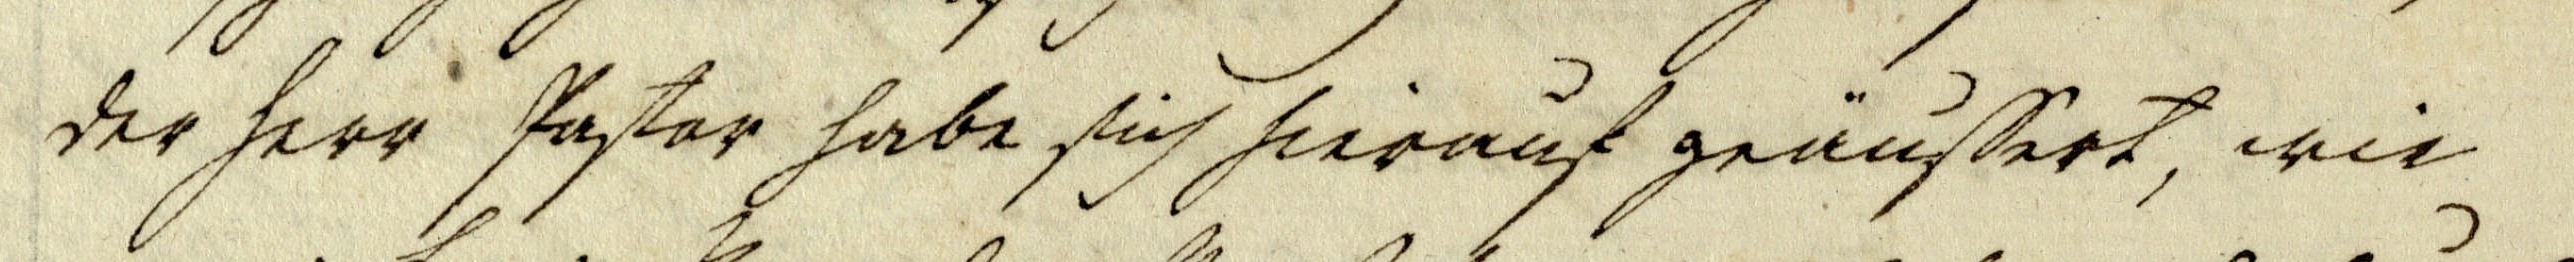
der Herr Pastor habe sich hierauf geäussert, wie
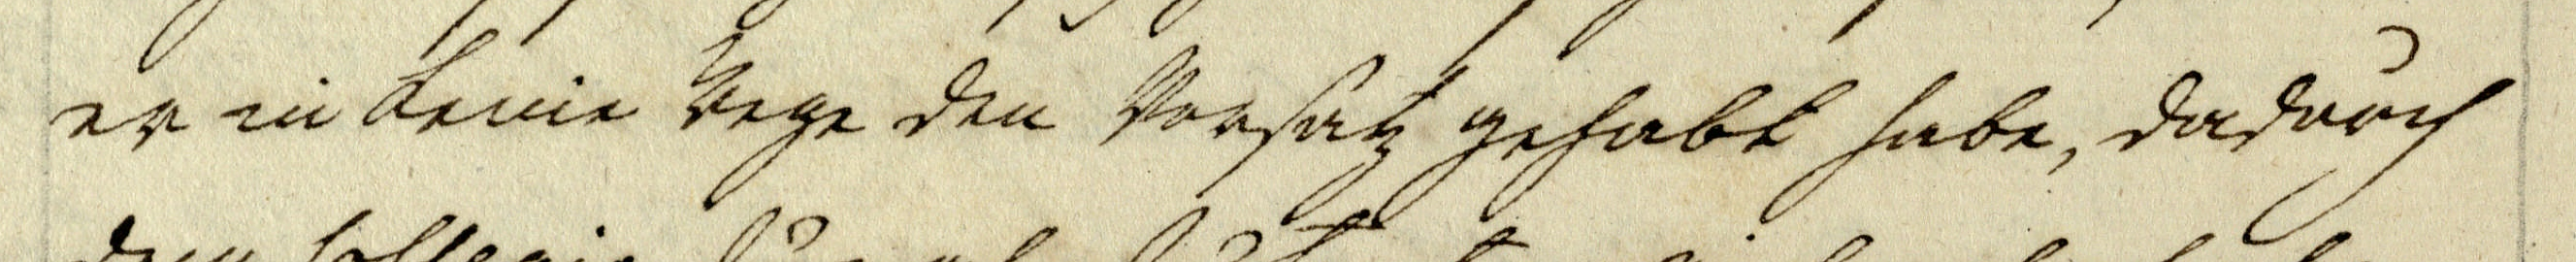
er in keine Wege den Vorsatz gehabt habe, dadurch
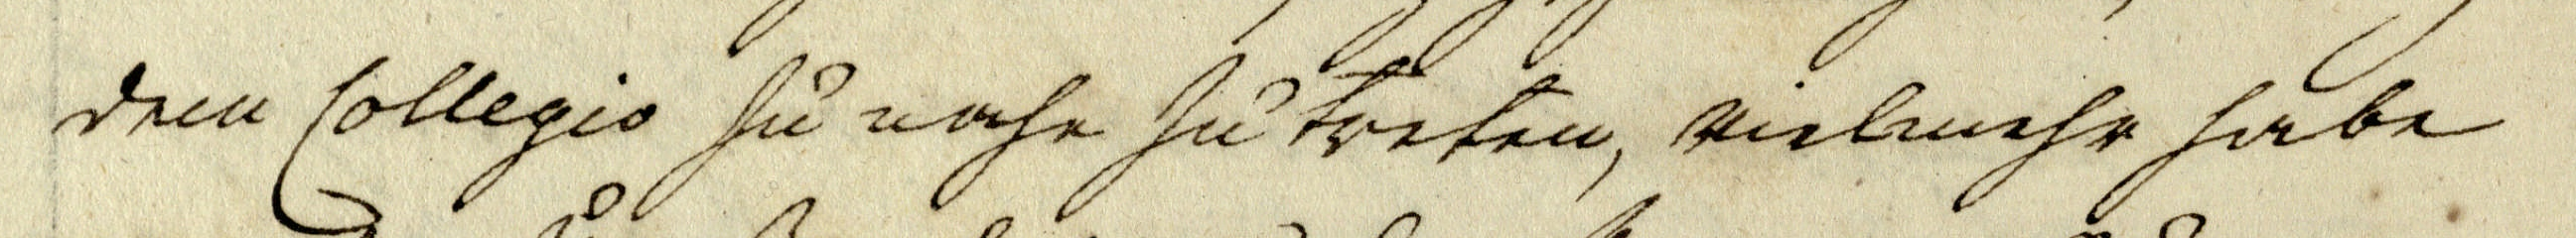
dem Collegio zu nahe zu treten, vielmehr habe
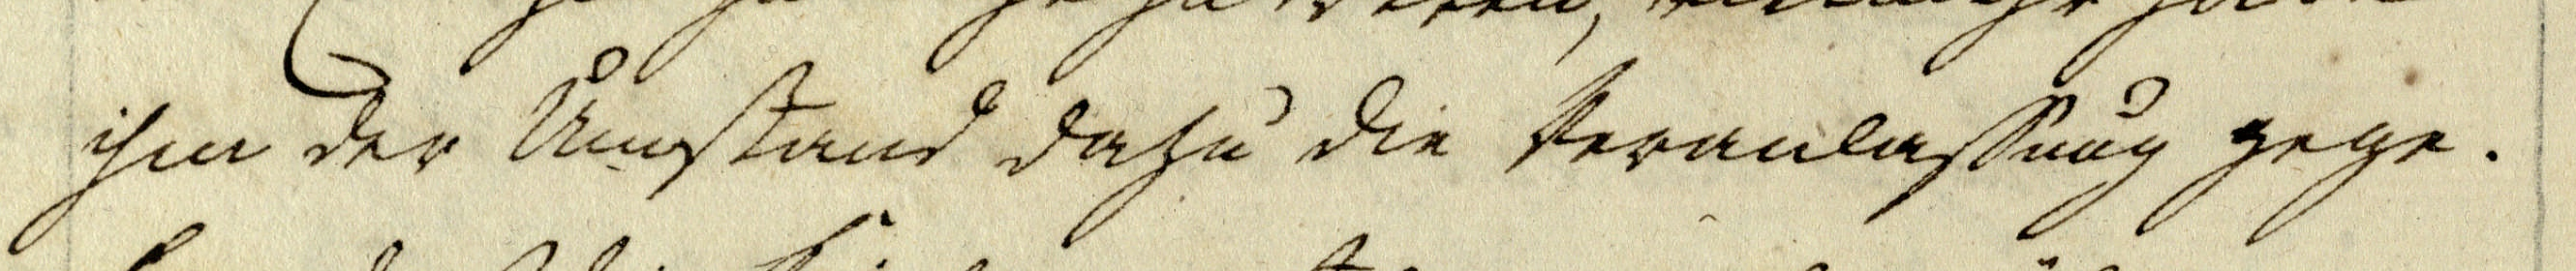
ihm der Umstand dazu die Veranlassung gege¬
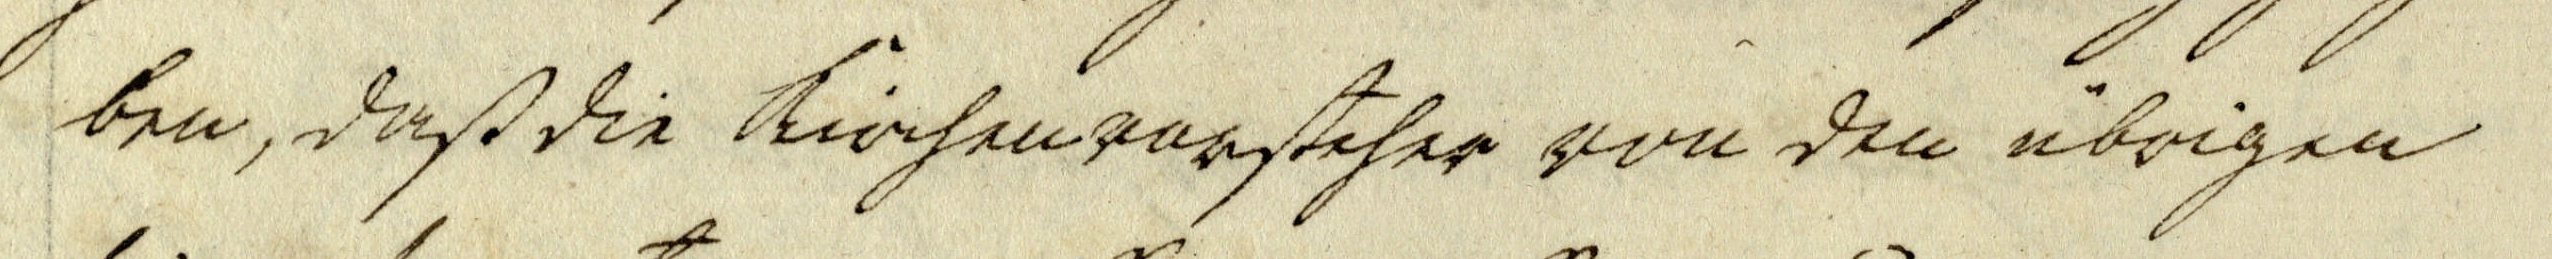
ben, daß die Kirchenvorsteher von den übrigen
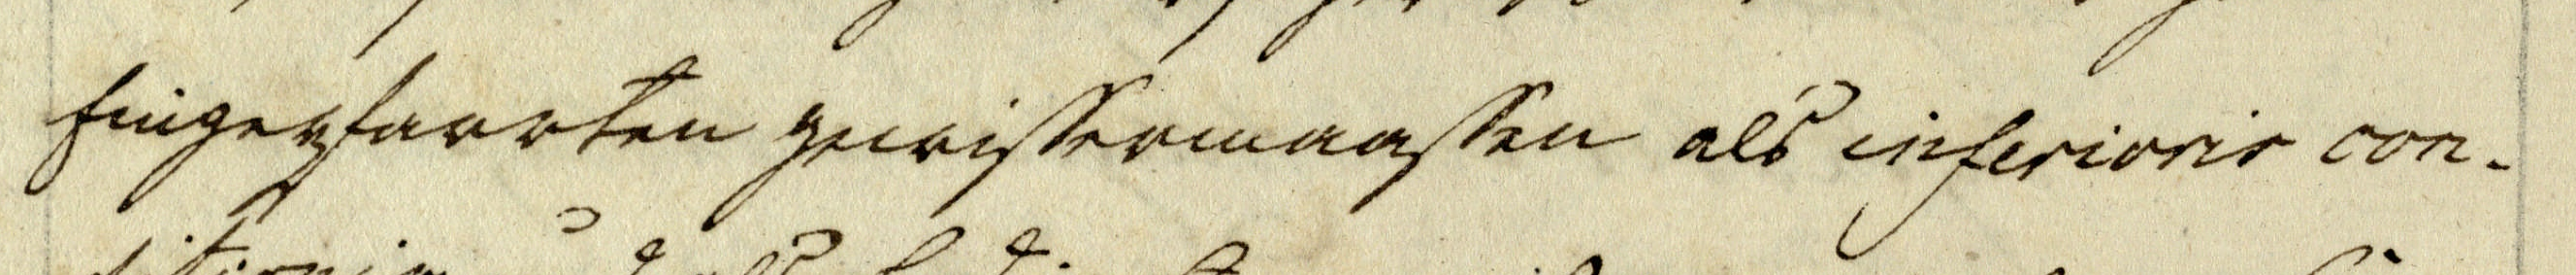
Eingepfarrten gewissermaassen als inferioris con¬
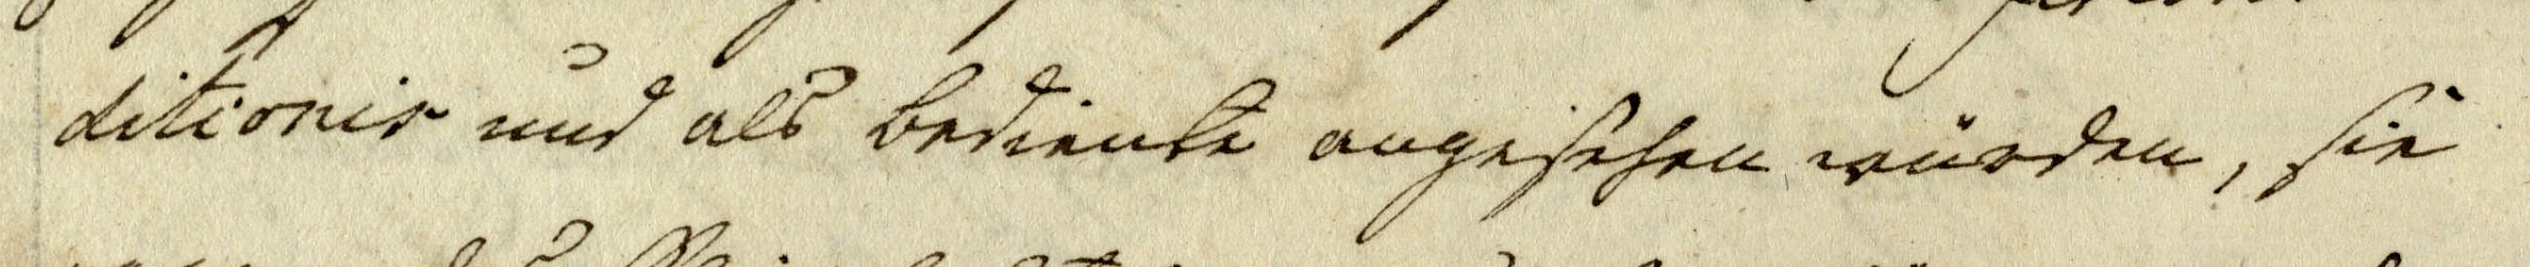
ditionis und als Bediente angesehen würden, sie
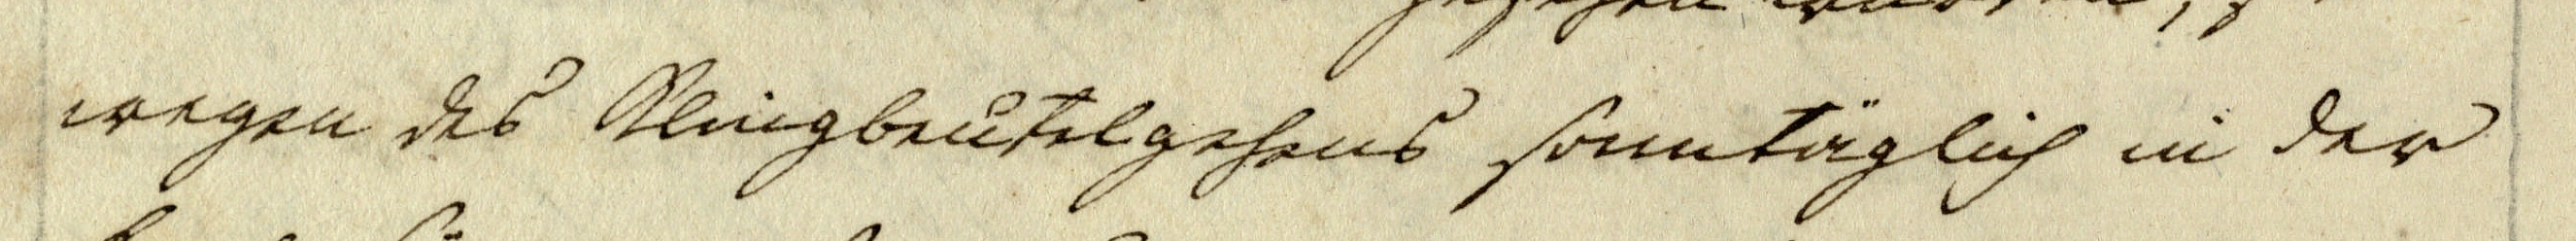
wegen des Klingbeutelgehens sonntäglich in der
